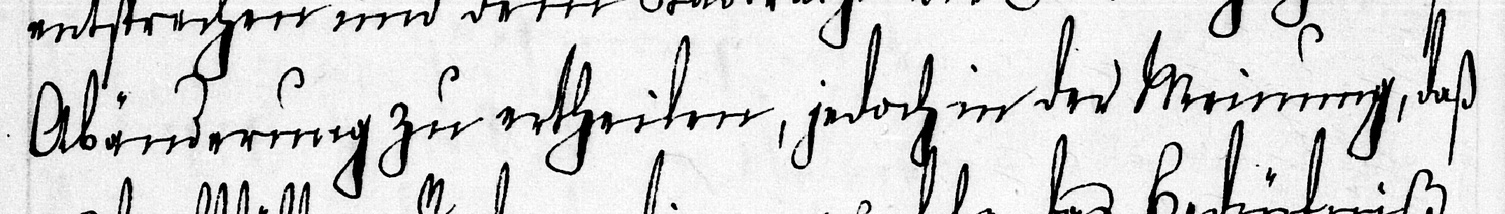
Abänderung zu ertheilen, jedoch in der Meinung, daß
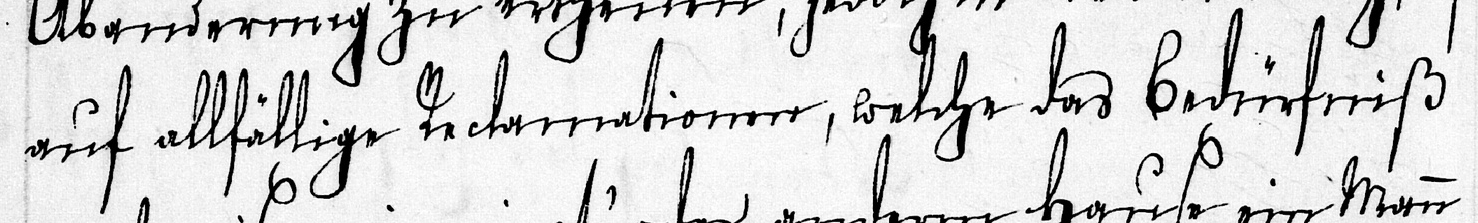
auf allfällige Reclamationen, welche das Bedürfniß
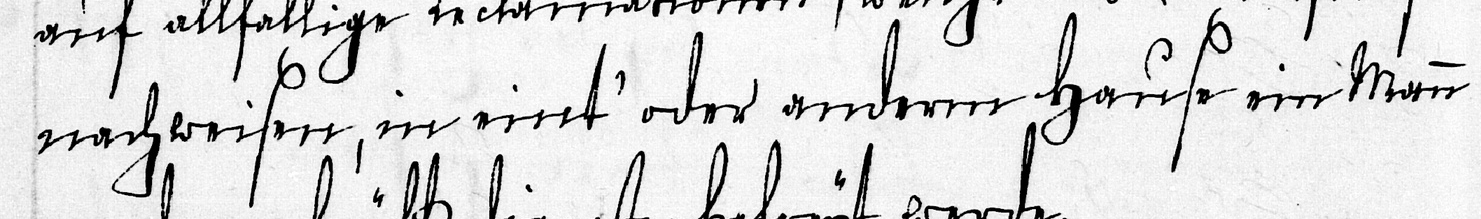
nachweisen, in eint’ oder anderm Hause ein Mann
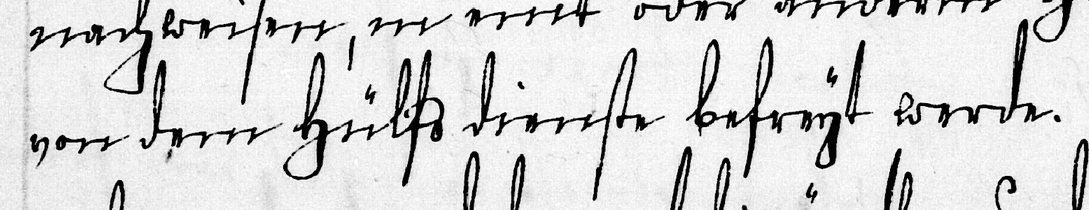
von dem Hülfsdienste befreyt werde.
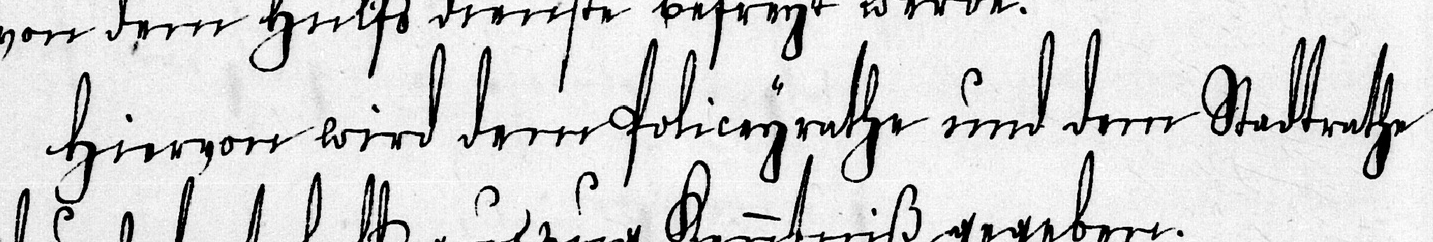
Hiervon wird dem Policeyrathe und dem Stadtrathe
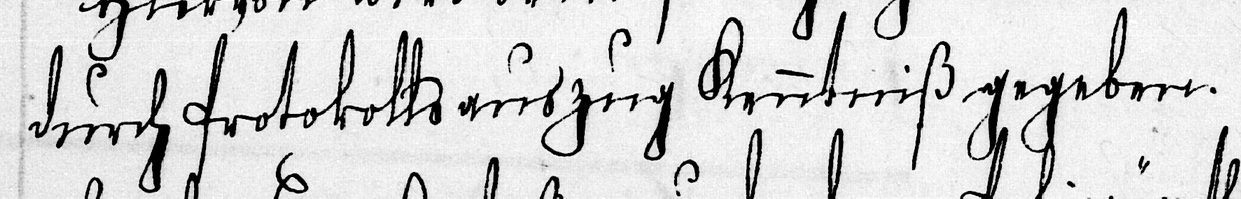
durch Protokollsauszug Kenntniß gegeben.
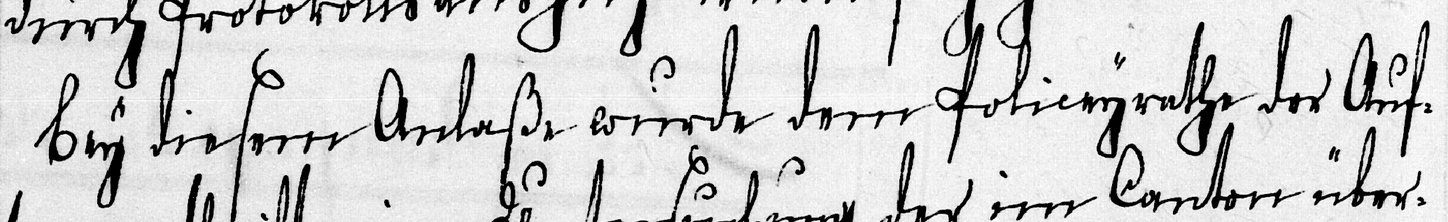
Bey diesem Anlaße wurde dem Policeyrathe der Auf¬
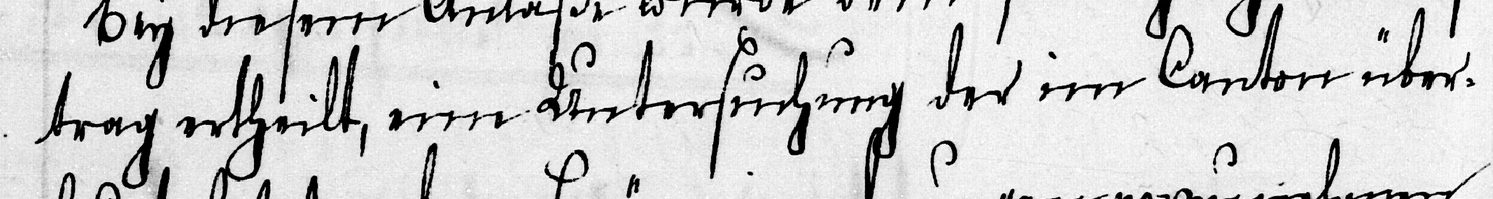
trag ertheilt, eine Untersuchung der im Canton über¬
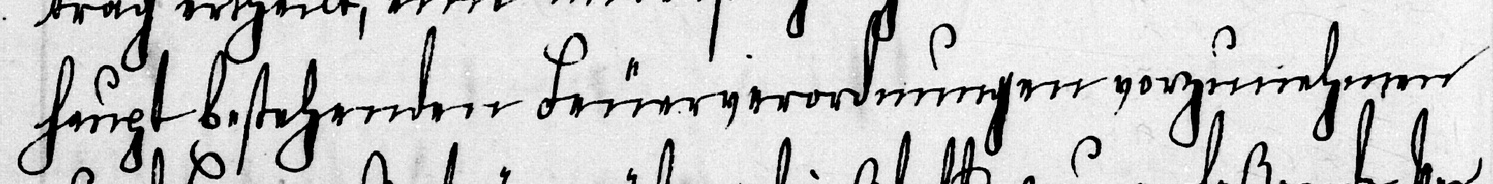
haupt bestehenden Feuerverordnungen vorzunehmen
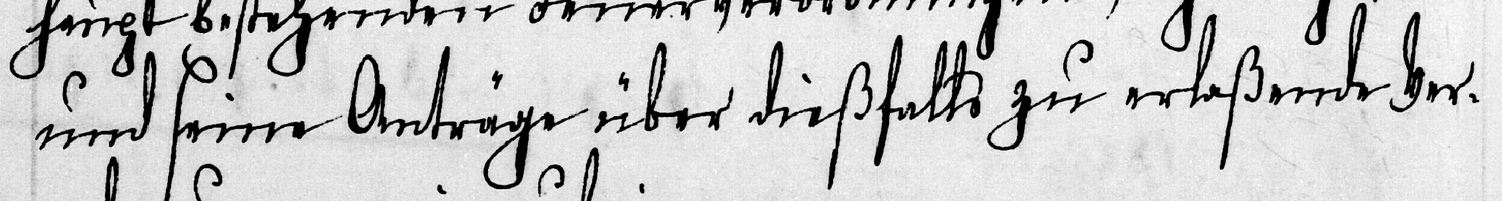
und seine Anträge über dießfalls zu erlaßende Ver¬
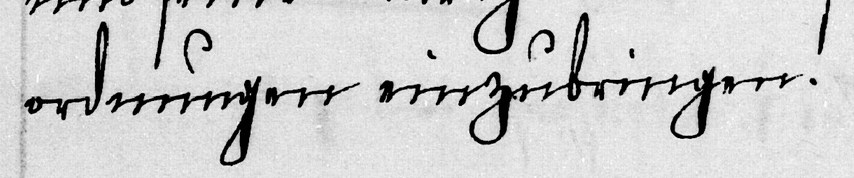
ordnungen einzubringen.
